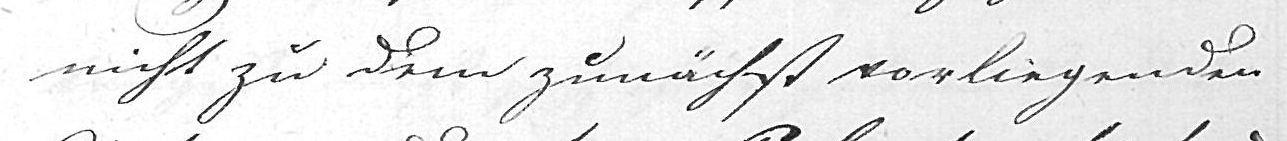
nicht zu dem zunächst vorliegenden
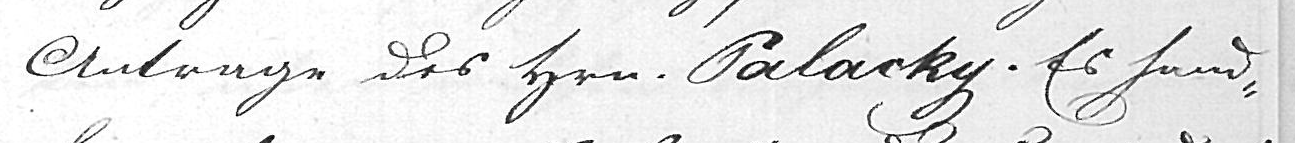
Antrage des Hrn. Palacky. Es hand-
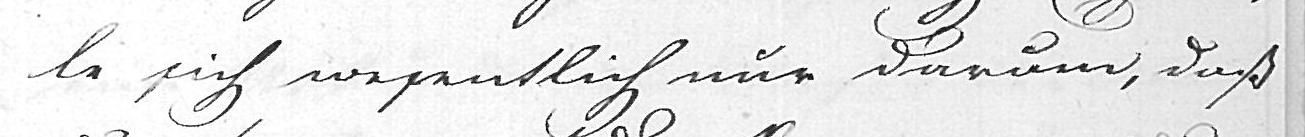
le sich wesentlich nur darum, daß
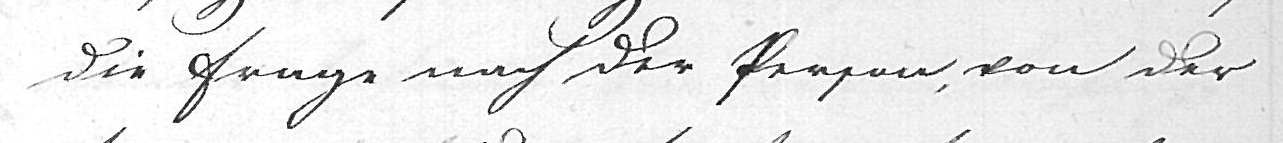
die Frage nach der Person von der
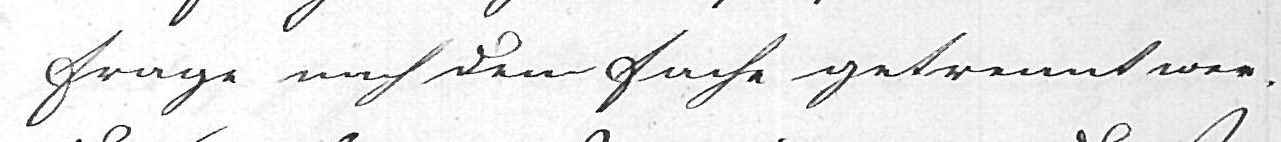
Frage auch dem Fache getrennt wer-
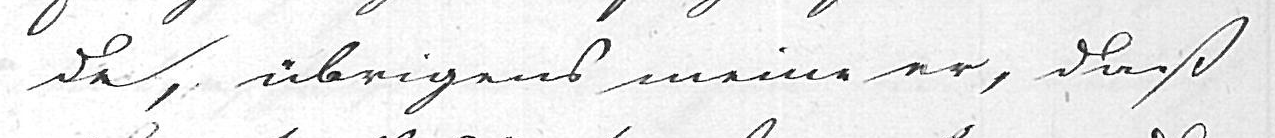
de, übrigens meine er, daß
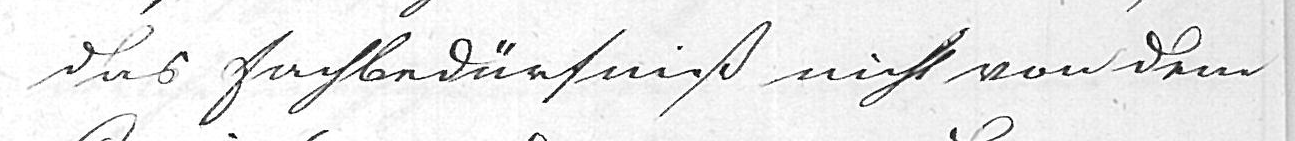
das Fachbedürfniß nicht von dem
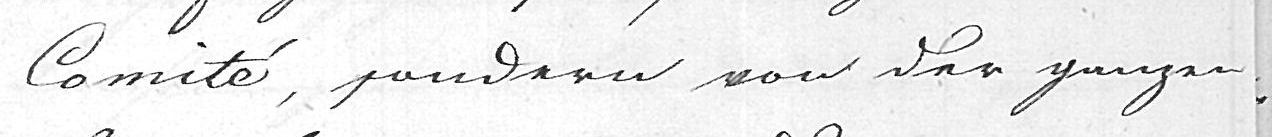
Comité, sondern von der ganzen
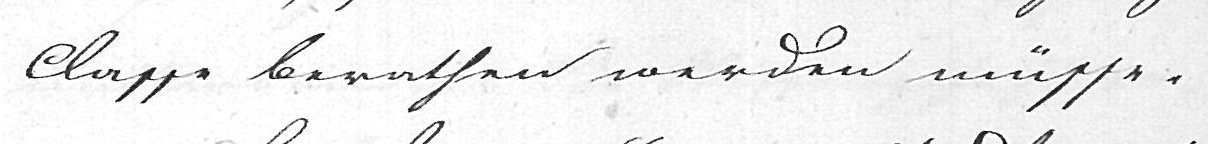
Classe berathen werden müsse.
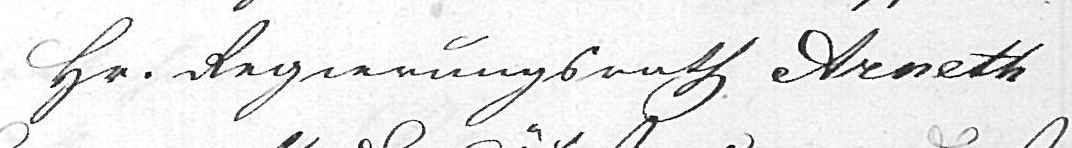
Hr. Regierungsrath Arneth
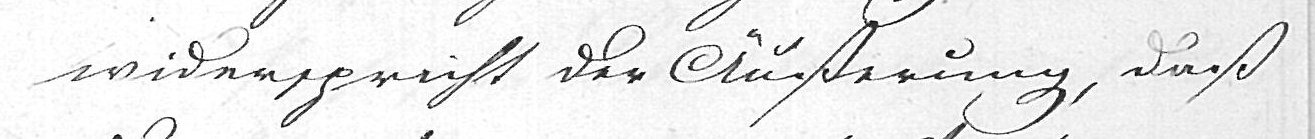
widerspricht der Äußerung, daß
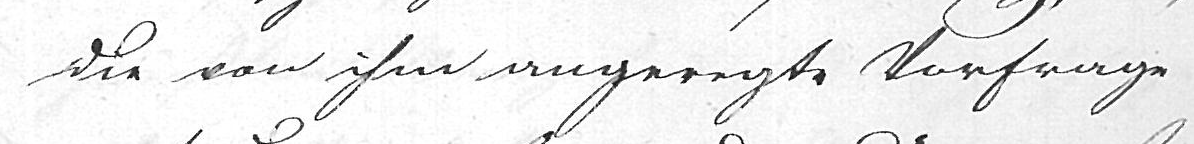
die von ihm angeregte Vorfrage
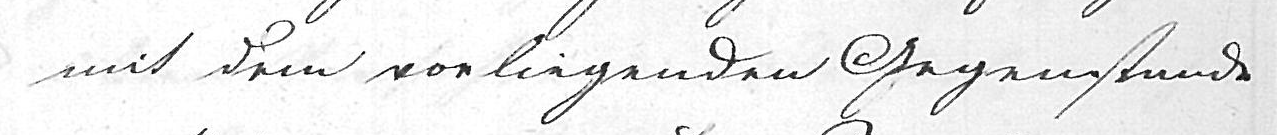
mit dem vorliegenden Gegenstande
